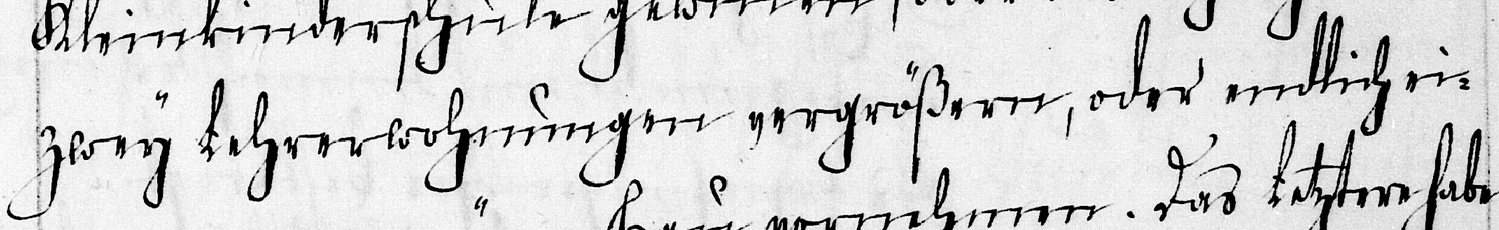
zwey Lehrerwohnungen vergrößern, oder endlich ei¬
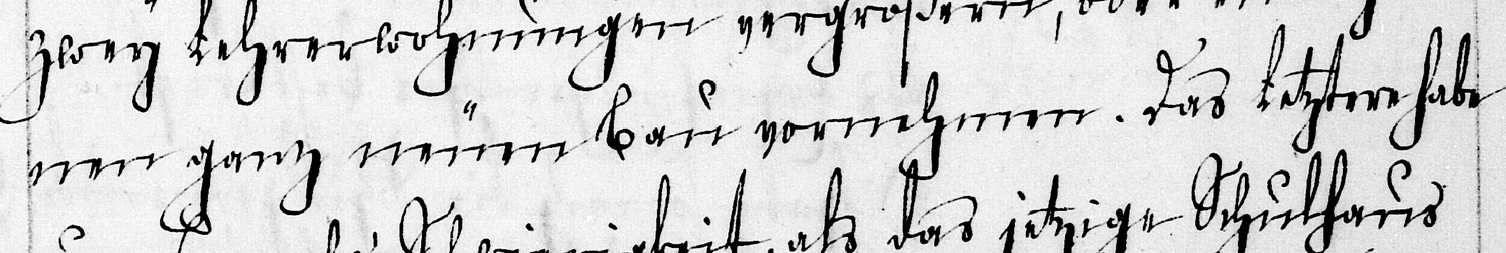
nen ganz neuen Bau vornehmen. Das Letztere habe
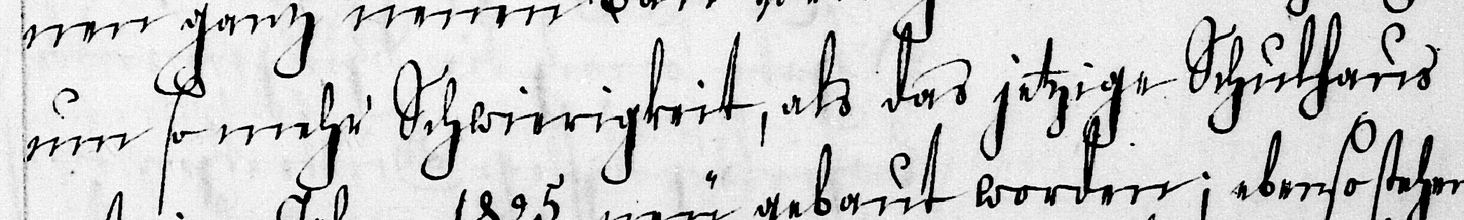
um so mehr Schwierigkeit, als das jetzige Schulhaus
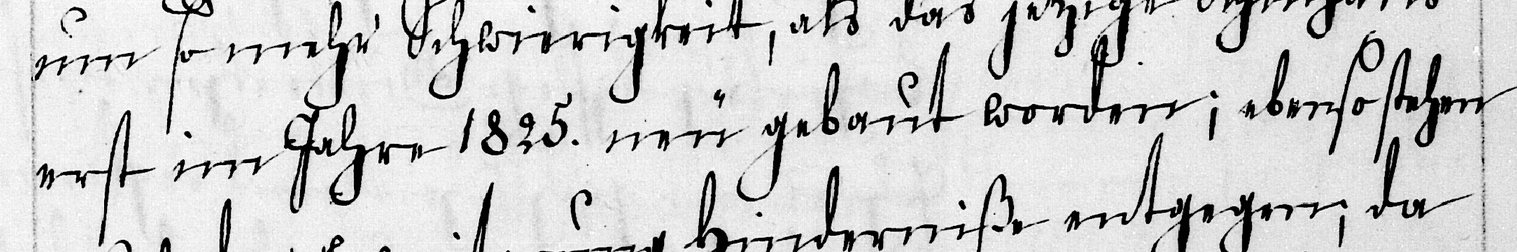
erst im Jahre 1825. neu gebaut worden; ebenso stehen
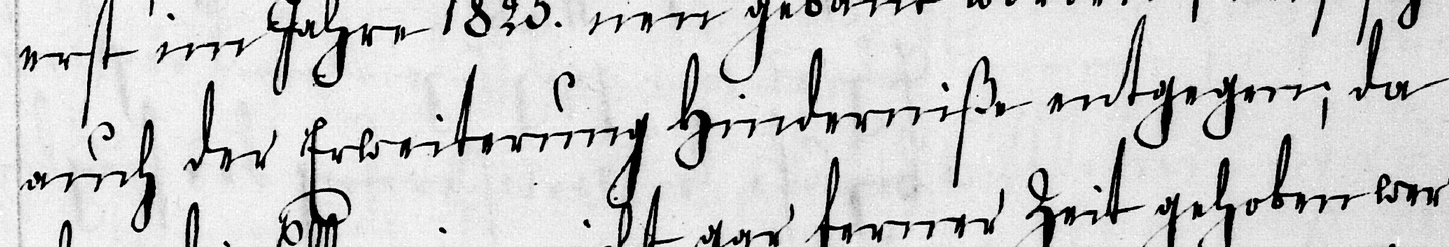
auch der Erweiterung Hinderniße entgegen; da
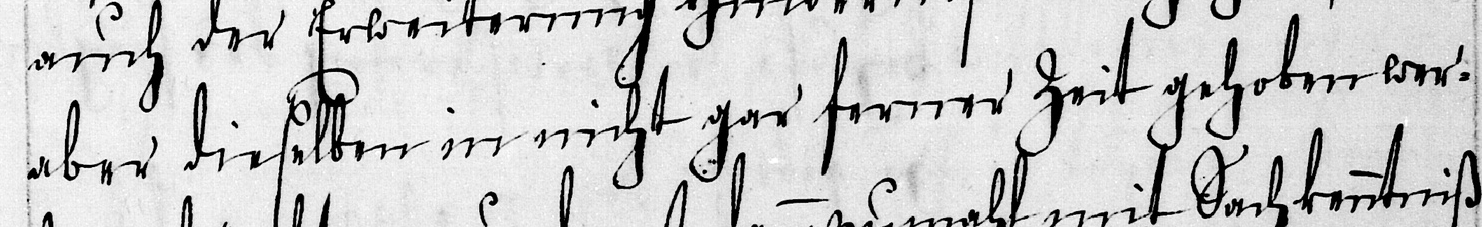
aber dieselben in nicht gar ferner Zeit gehoben wer¬
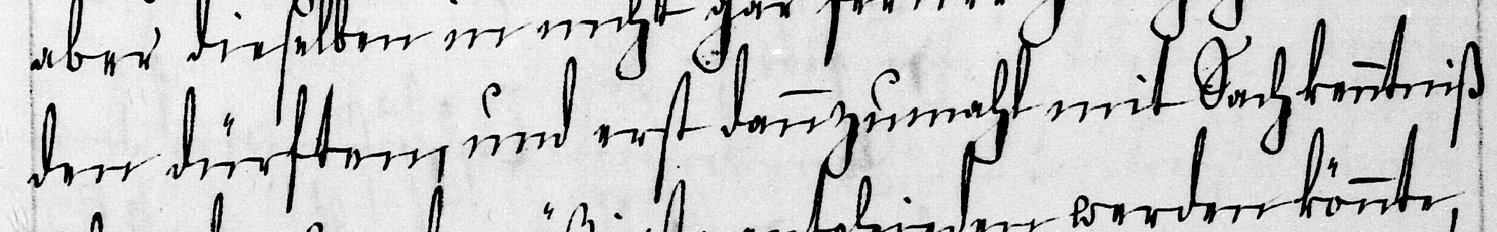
den dürften, und erst dannzumahl mit Sachkenntniß
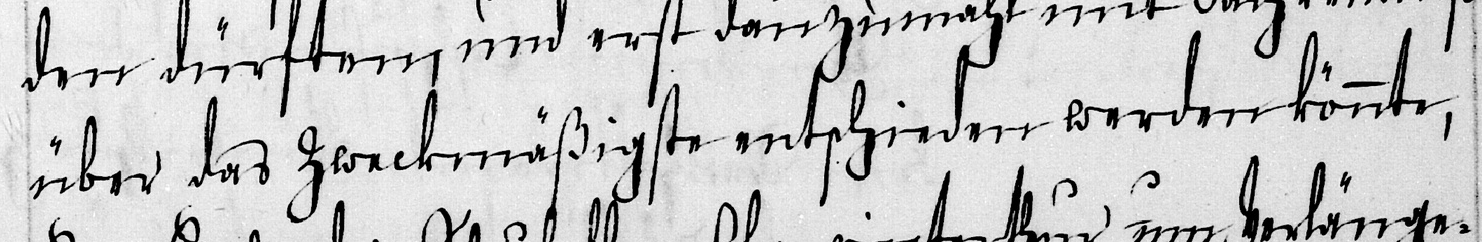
über das Zweckmäßigste entschieden werden könnte,
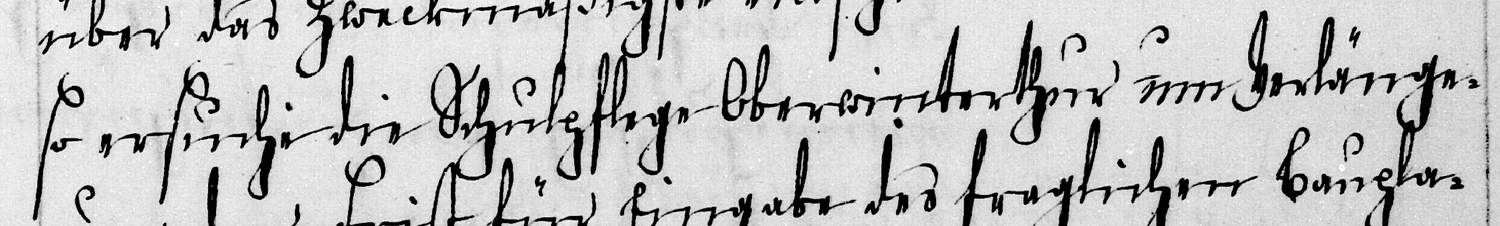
so ersuche die Schulpflege Oberwinterthur um Verlänge¬
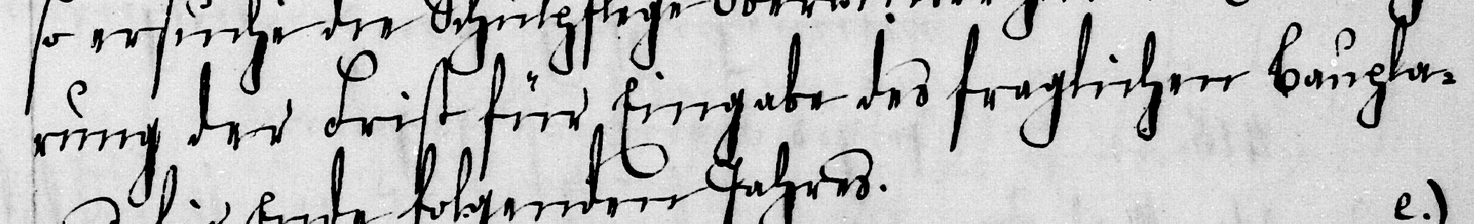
rung der Frist für Eingabe des fraglichen Baupla¬
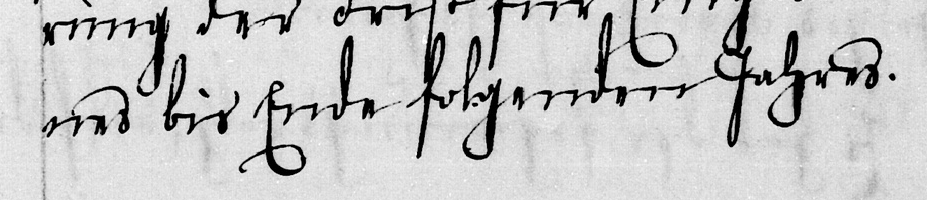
nes bis Ende folgenden Jahres.
